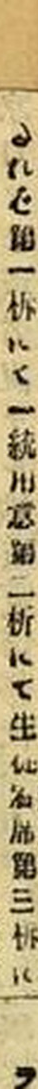たれば第一柝にて一統用意第二柝にて生徒着席第三柝に
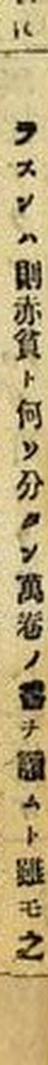ラスンハ則赤貧ト何ソ分タン万巻ノ書ヲ読ムト雖モ之
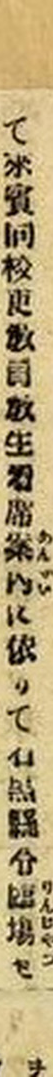て来賓同校吏教員教生着席案内に依りて石黒県令臨場せ
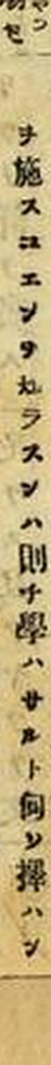ヲ施スユエンヲ知ラスンハ則チ学ハサルト何ソ擇ハン
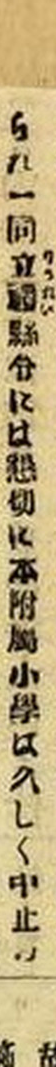られ一同立礼県令には懇切に本附属小学は久しく中止の
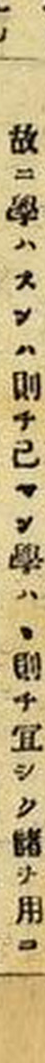故ニ学ハズンハ則チ已マン学ハヽ則チ宜シク諸ヲ用ニ
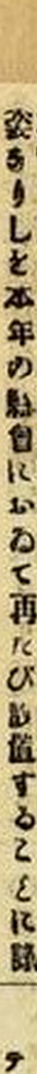姿なりしを本年の県会におゐて再たび設置することに議
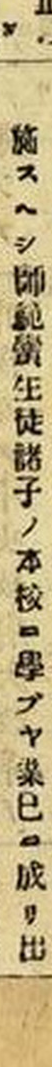施スヘシ師範校生徒諸子ノ本校ニ学ブヤ業已ニ成リ出
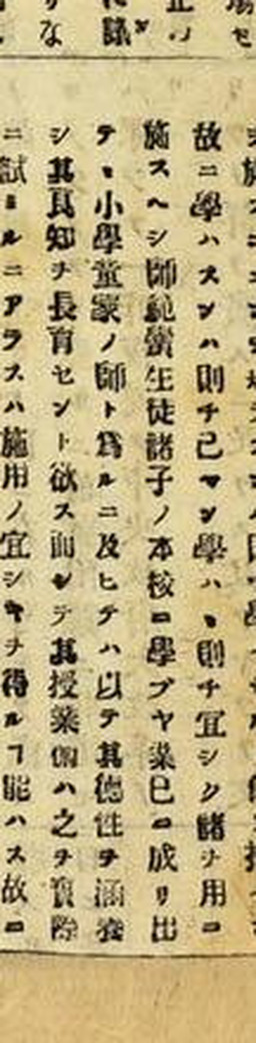テヽ小学童蒙ノ師ト為ルニ及ヒテハ以テ其徳性ヲ涵養
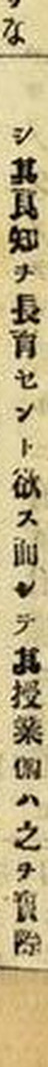シ其良知ヲ長育セント欲ス而シテ其授業ハ之ヲ実際
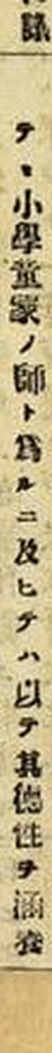テヽ小学童蒙ノ師ト為ルニ及ヒテハ以テ其徳性ヲ涵養
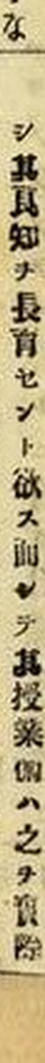シ其良知ヲ長育セント欲ス而シテ其授業ハ之ヲ実際
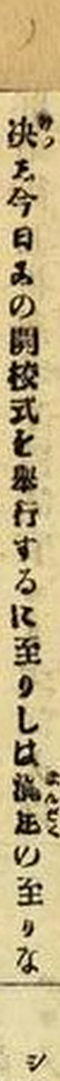決し今日この開校式を挙行するに至りしは満足の至りな
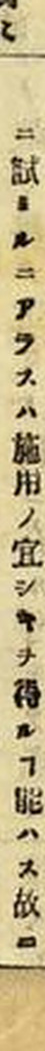ニ試ミルニアラスハ施用ノ宜シキヲ得ルヿ能ハス故ニ
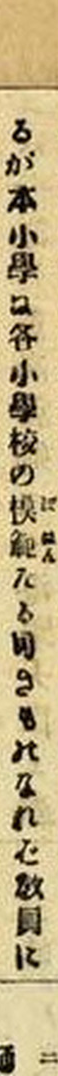るが本小学は各小学校の模範たるへきものなれば教員に
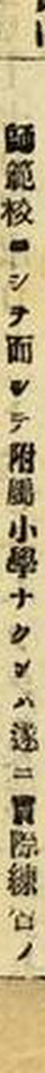師範校ニシテ而シテ附属小学ナクンハ遂ニ実際練習ノ
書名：温古集 五巻
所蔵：福井県文書館 Fukui Prefectural Archives
